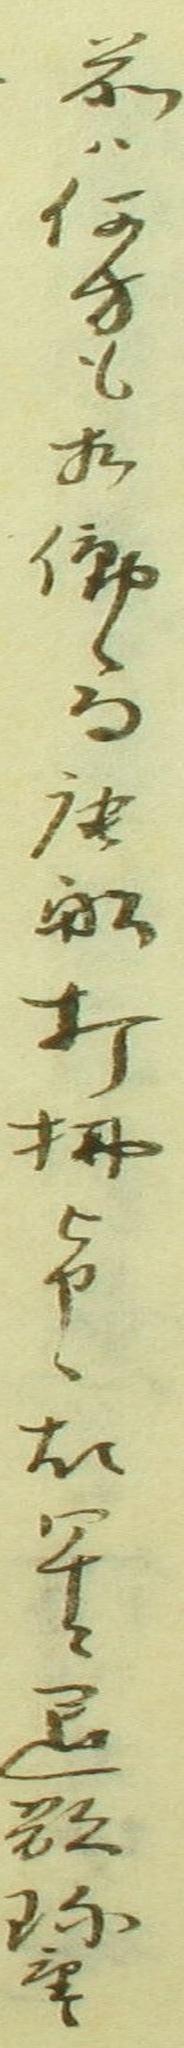前ハ何方も相働候而唐船打払被申候故早々退散珍重候
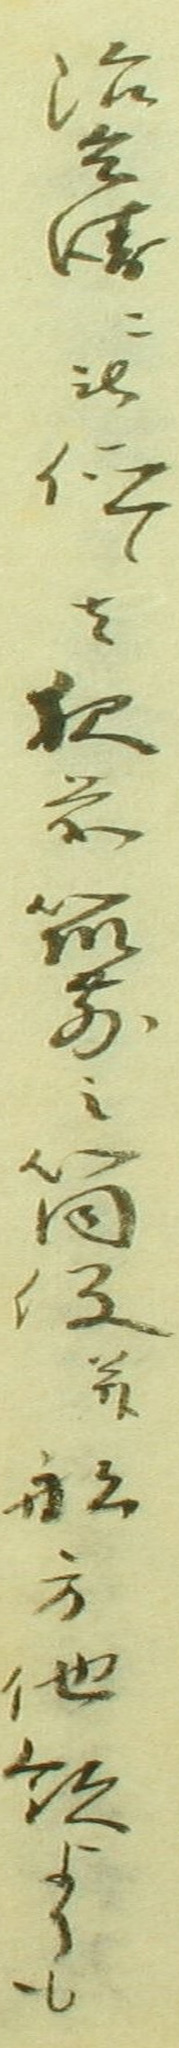治兵衛ニ被仰候は夜前筑前之筒役幷船方他領よりも
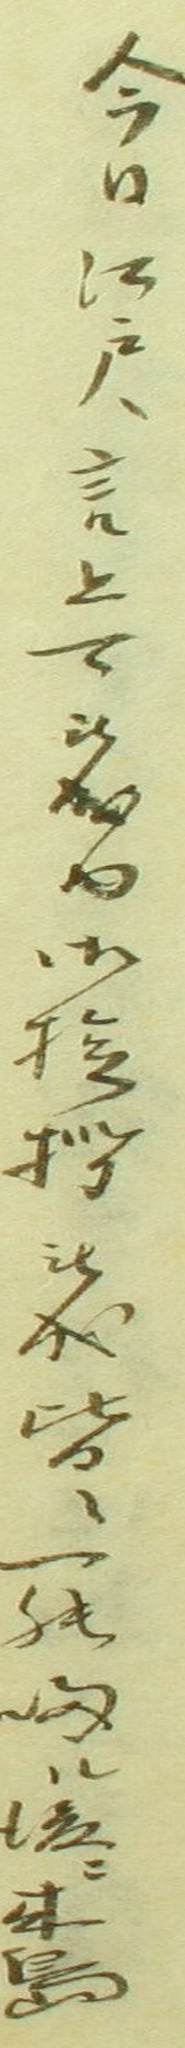今日江戸へ言上可被成候御挨拶被成皆々罷帰ル後ニ来島
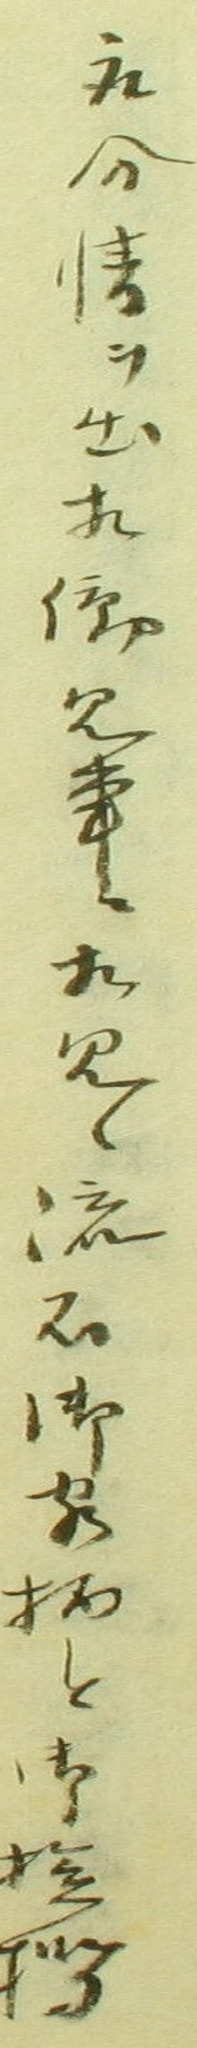取分情ヲ出相働見事に相見候流石御家柄と御挨拶
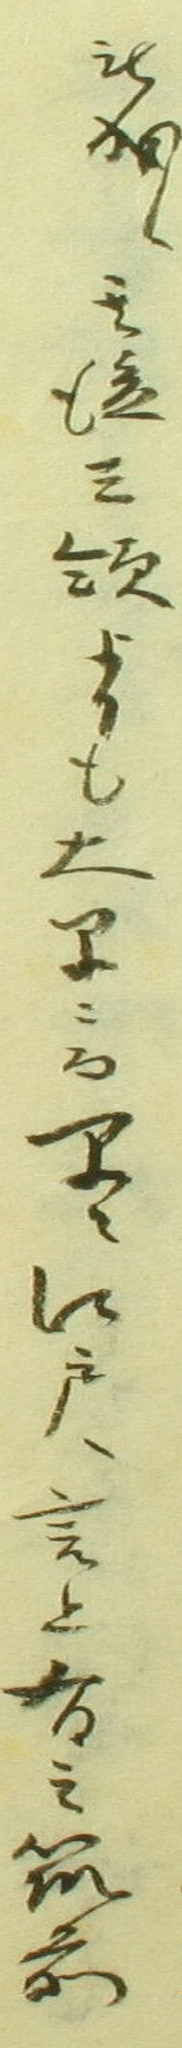被成候其後三領よりも大早ニ而早々江戸へ言上有之筑前
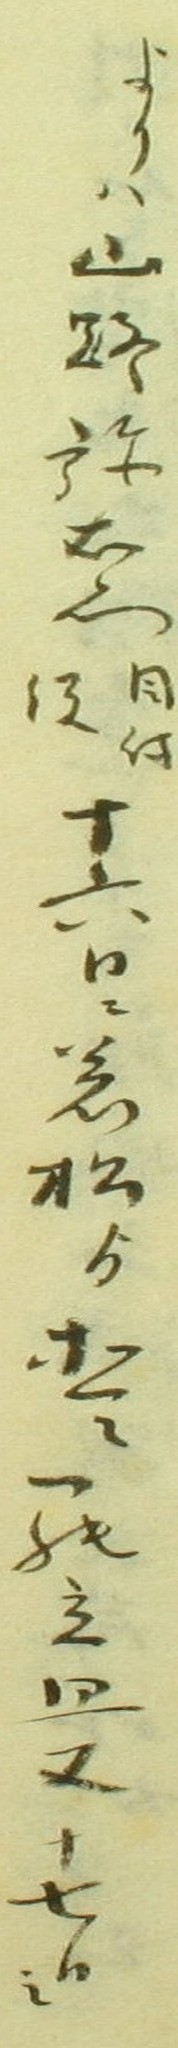よりは山路弥右衛門目付役十六日ニ若松ゟ直ニ罷立且又十七日之
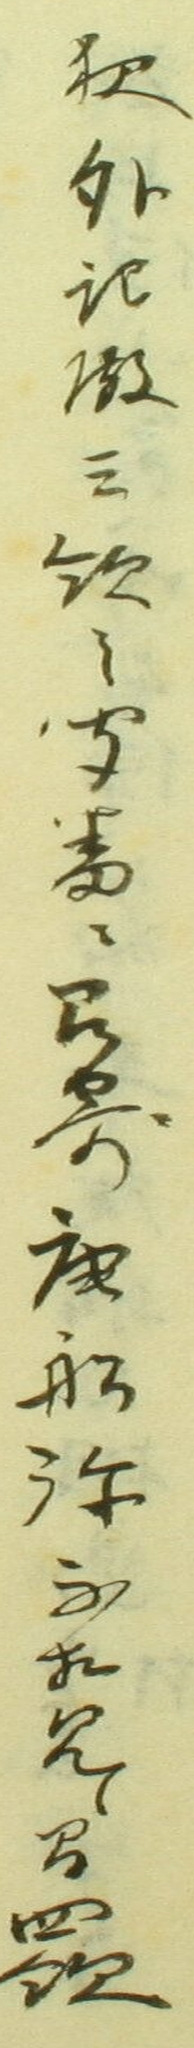夜外記殿三領之聞番ニ召寄唐船弥不相見候間四領
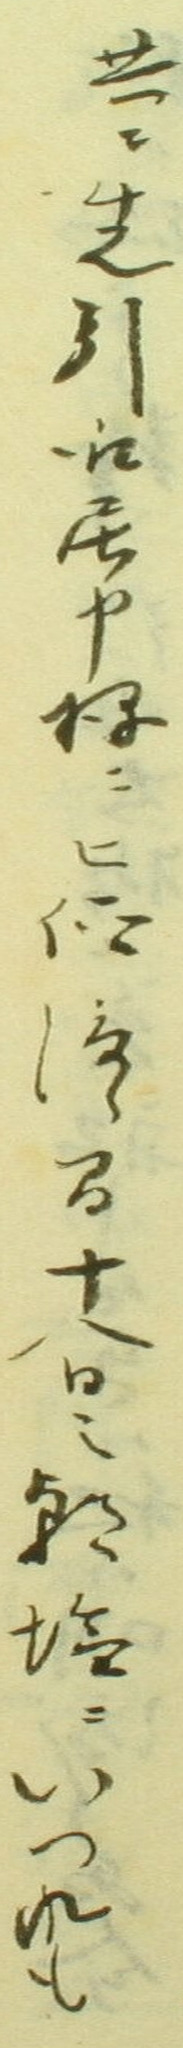共ニ先引取居申上様ニ被仰渡候間十八日之朝塩ニいつれも
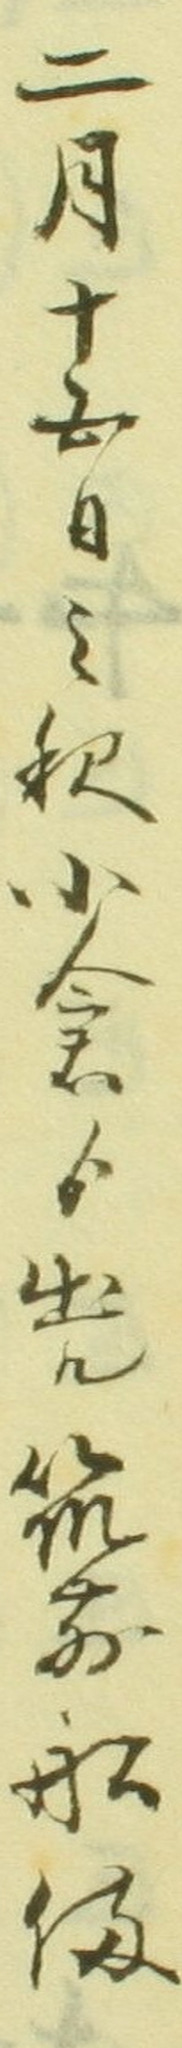二月十五日之夜小倉ゟ出ル筑前船備
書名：唐船漂流記 二
